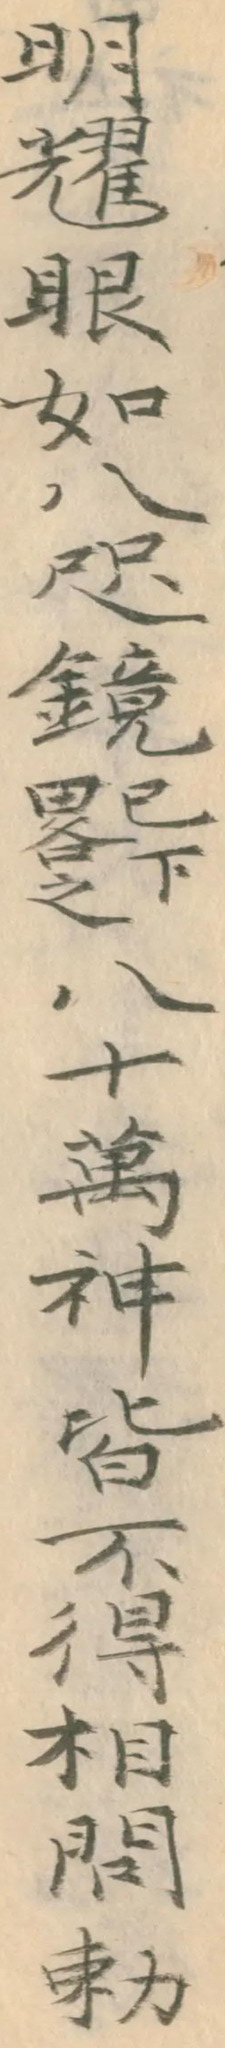明耀眼如八咫鏡已下略之八十万神皆不得相問勅
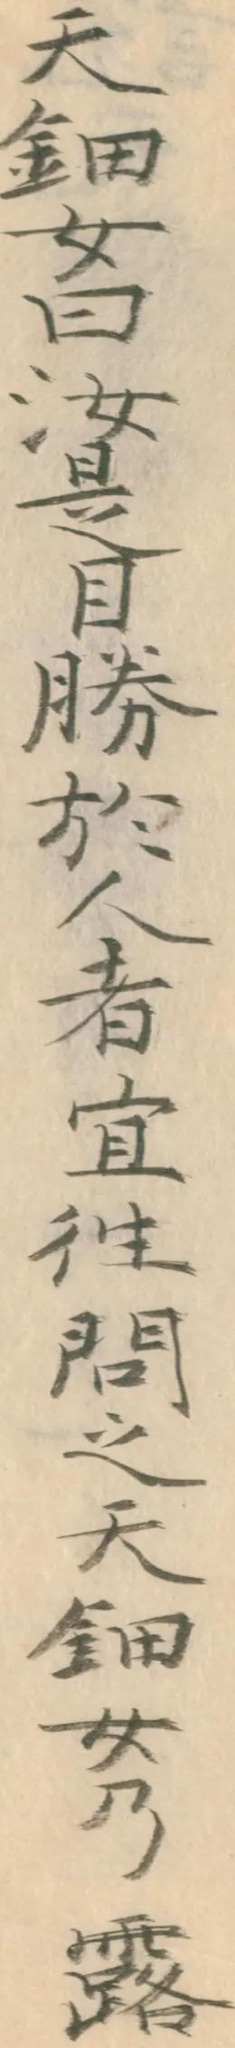天鈿女曰汝是目勝於人者宜往問之天細女乃露
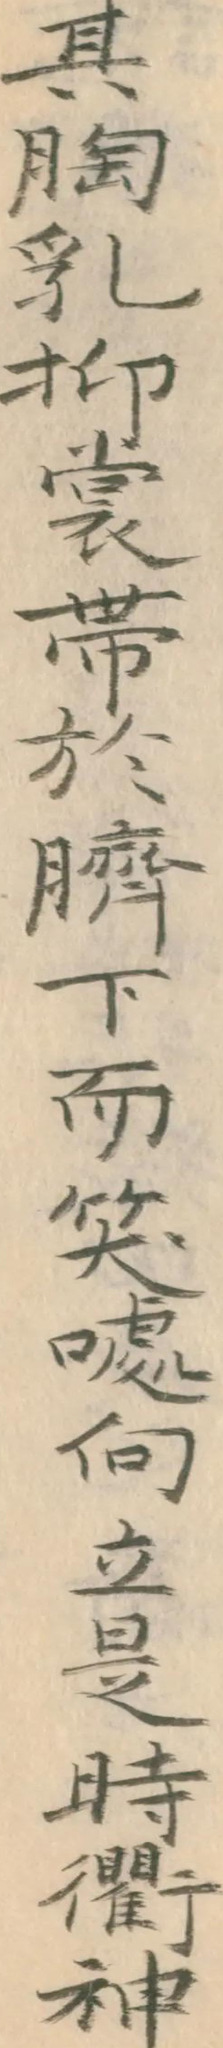其胸乳抑裳帯於臍下而笑処向立是時衢神
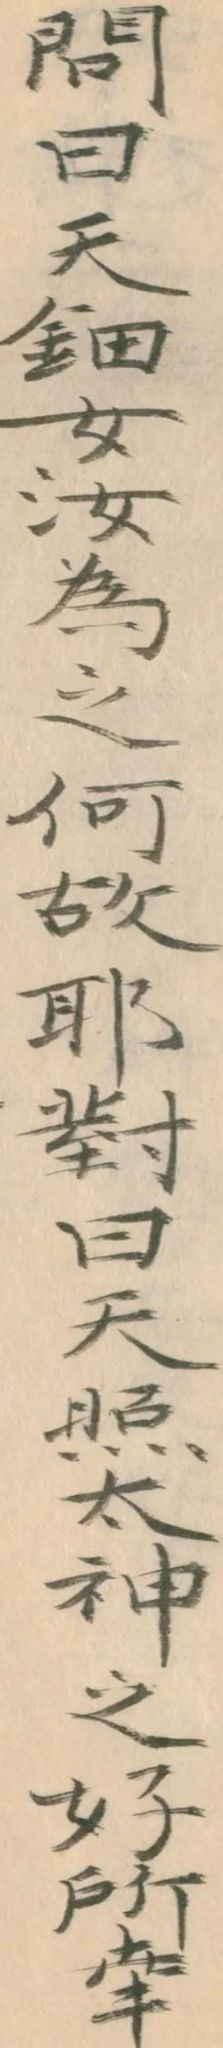問曰天鈿女汝為之何故耶対曰天照太神之好所幸
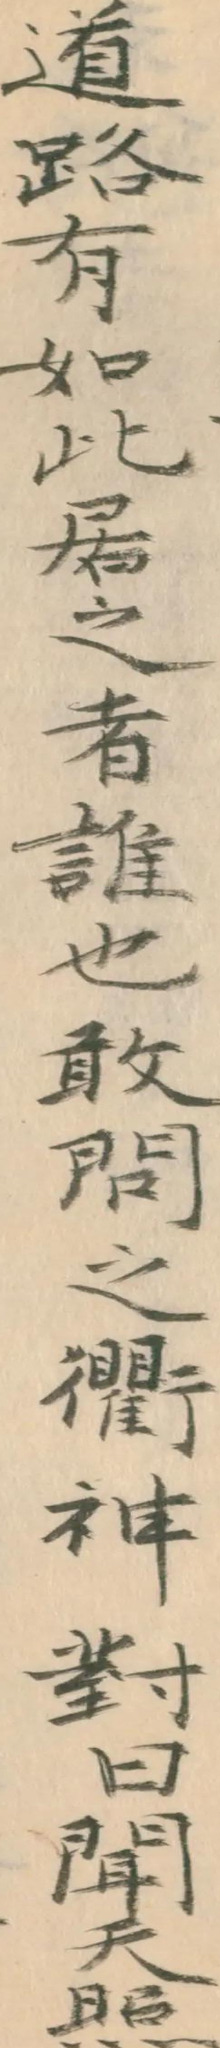道路有如此居之者誰也敢問之衢神対曰聞天照
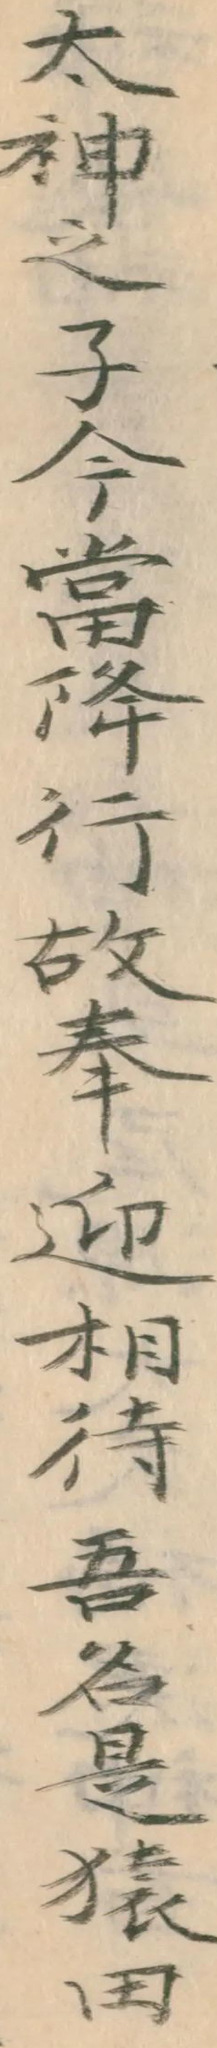太神之子今当降行故奉迎相待吾名是猿田
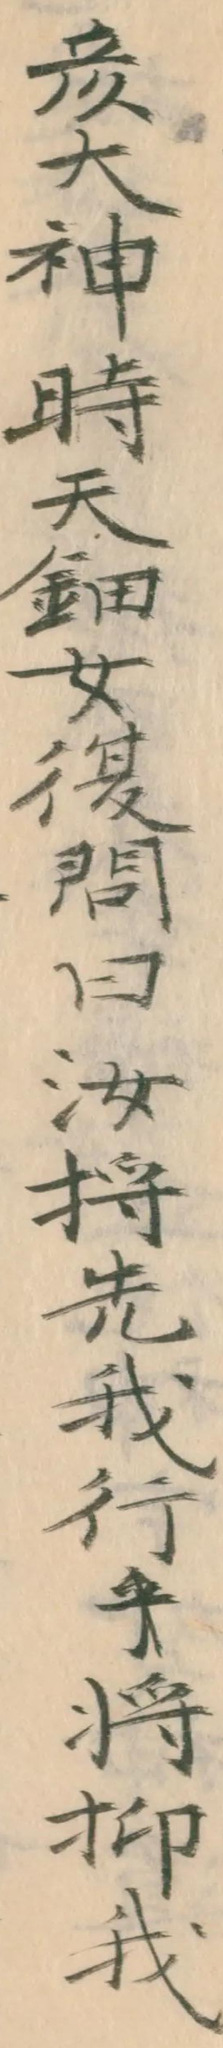彦大神時天鈿女復問曰汝将先我行乎将抑我
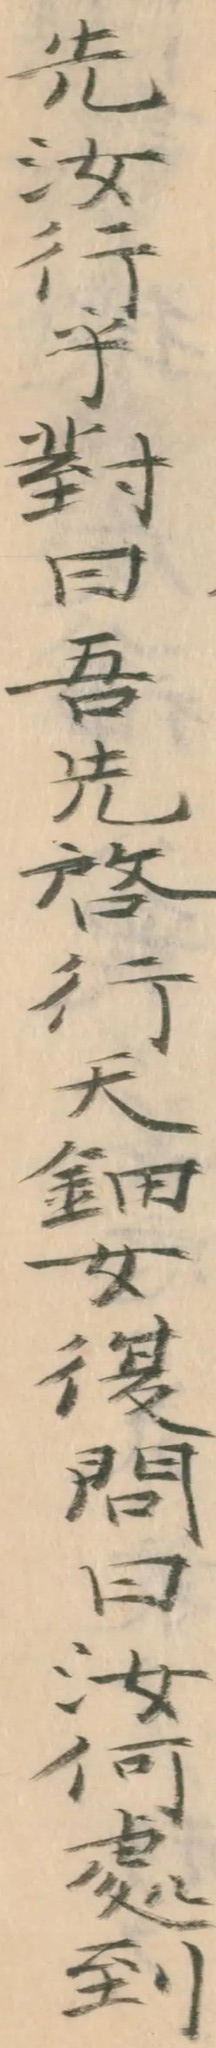先汝行乎対曰吾先啓行天鈿女復問曰汝何処到
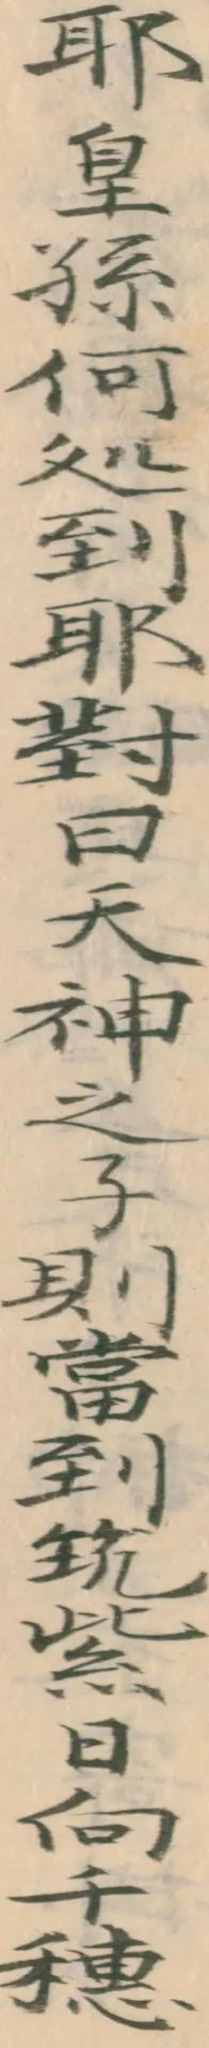耶皇孫何処到耶対曰天神之子則当到筑紫日向千穂
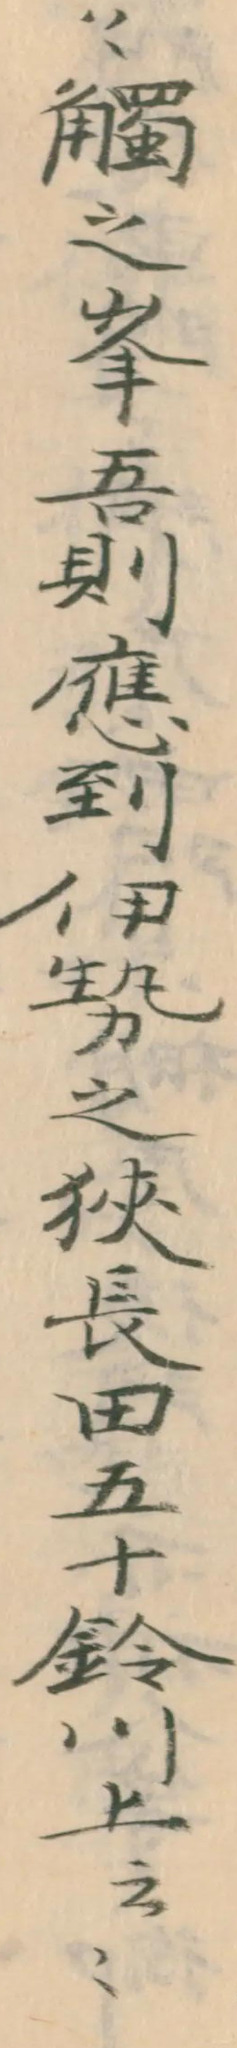々触之峯吾則応到伊勢之狭長田五十鈴川上云々
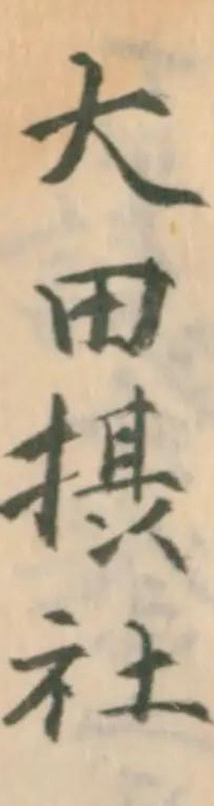大田摂社
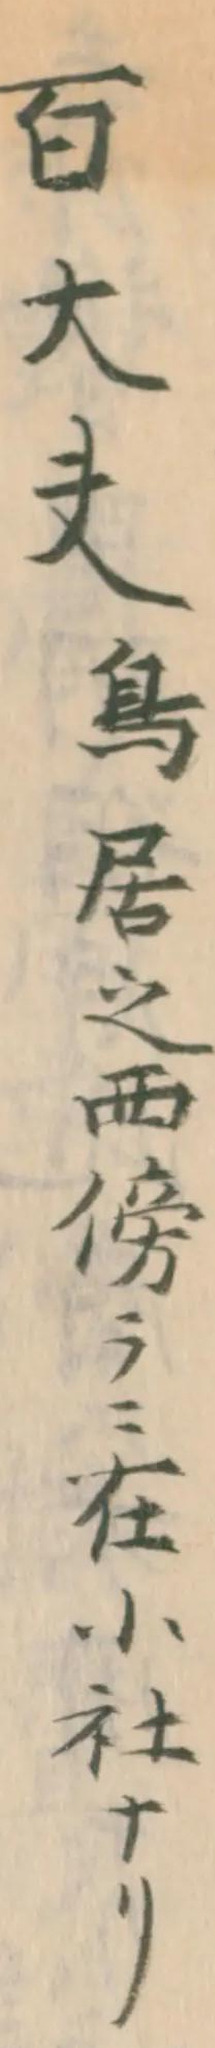百大夫鳥居之西傍ラニ在小社ナリ
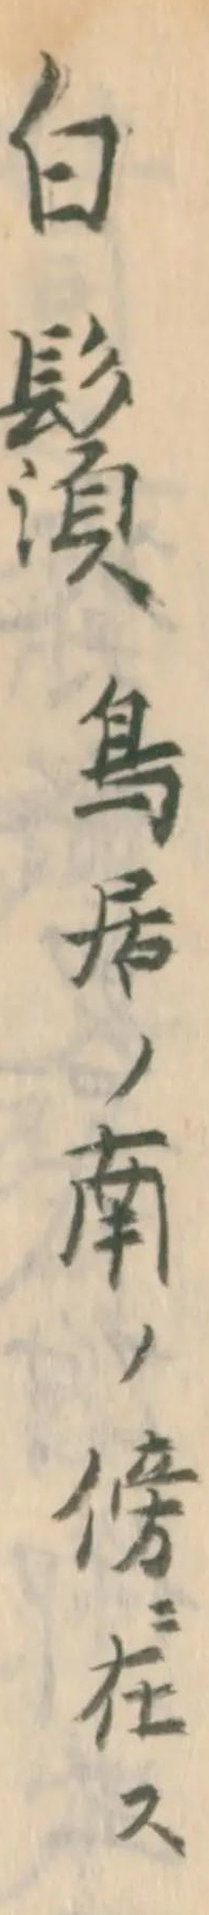白鬚鳥居ノ南ノ傍ニ在ス
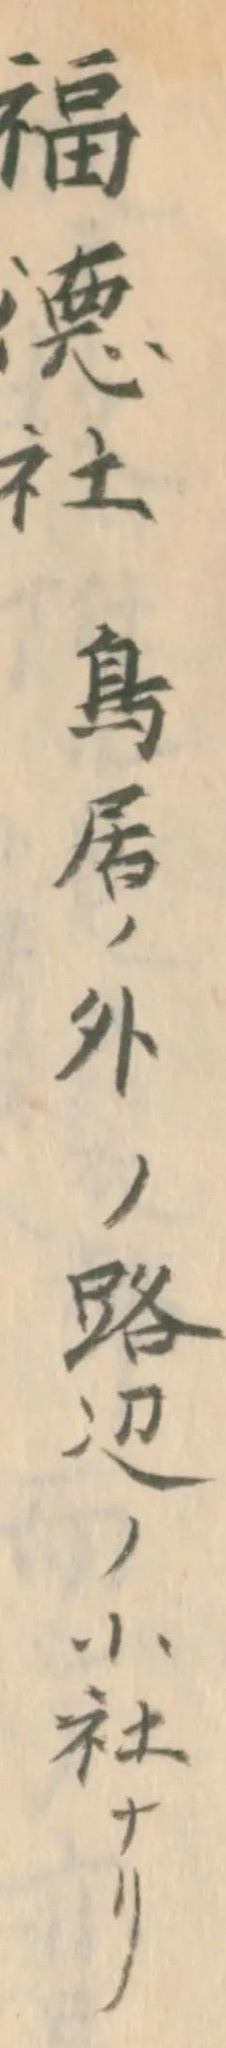福徳社鳥居ノ外ノ路辺ノ小社ナリ
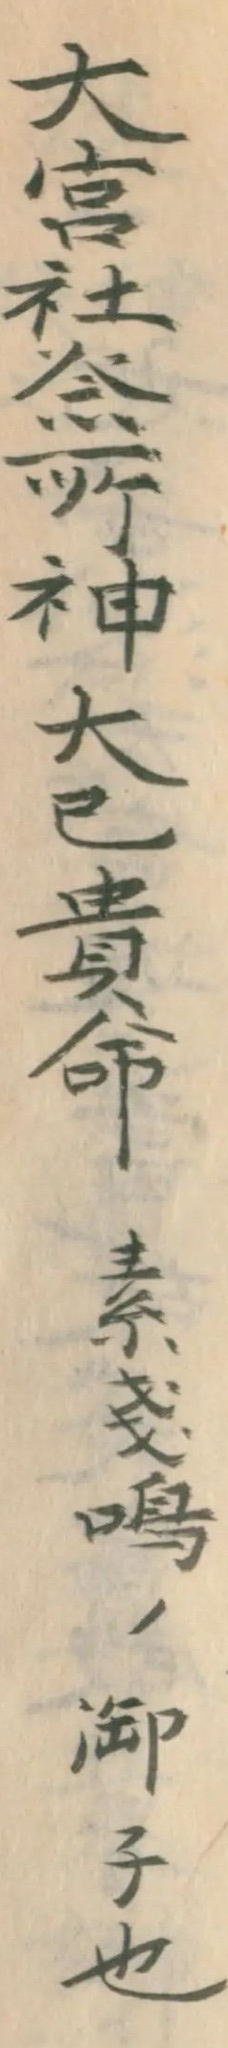大宮社祭所神大己貴命素戔嗚ノ御子也
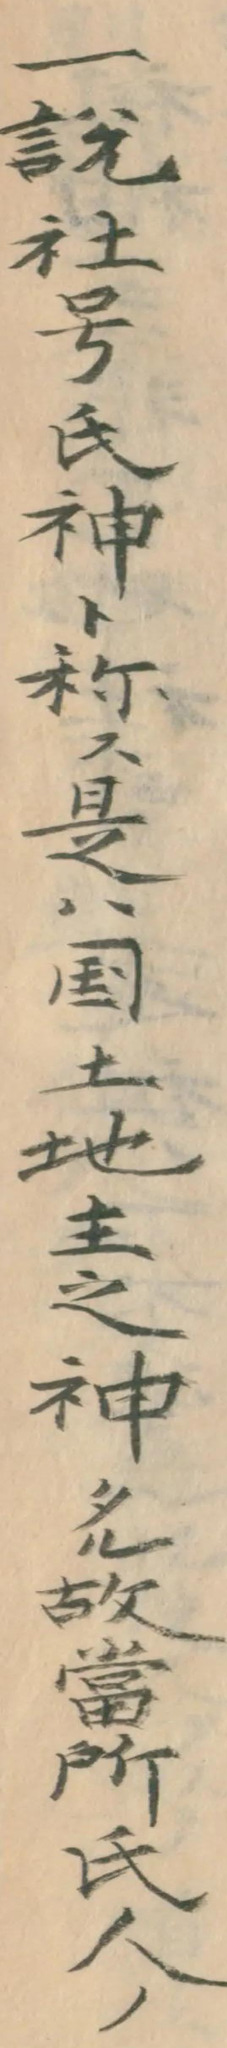一説社号氏神ト称ス是ハ国土地主之神タル故当所氏人ノ
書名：賀茂社記録. 第91冊
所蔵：国立国会図書館 National Diet Library, JAPAN
